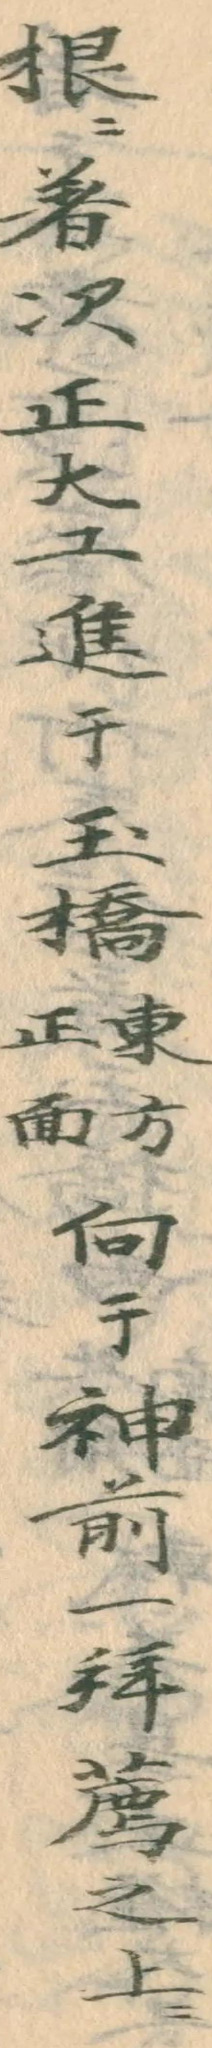根ニ着次正大工進于玉橋東方正面向于神前一拝薦之上ニ
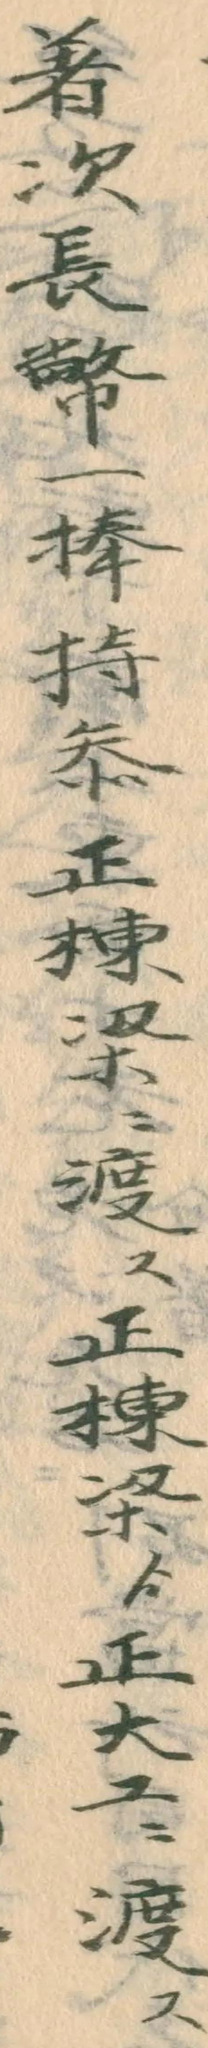着次長幣一捧持参正棟梁ニ渡ス正棟梁ゟ正大工ニ渡ス
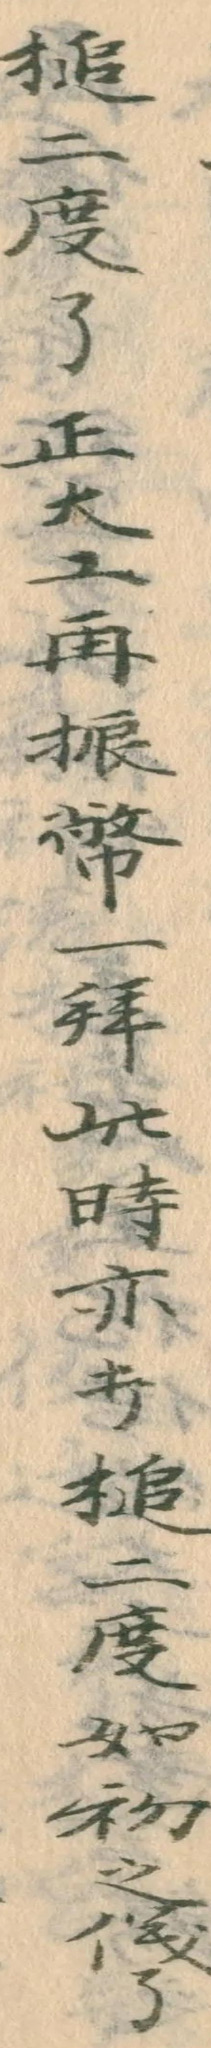槌二度了正大工再振幣一拝此時亦打槌二度如初之儀了
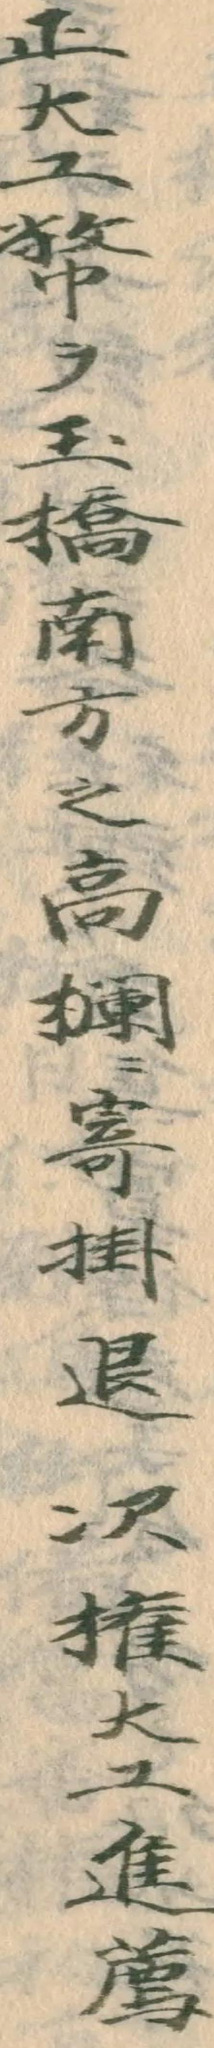正大工幣ヲ玉橋南方之高欄ニ寄掛退次権大工進薦
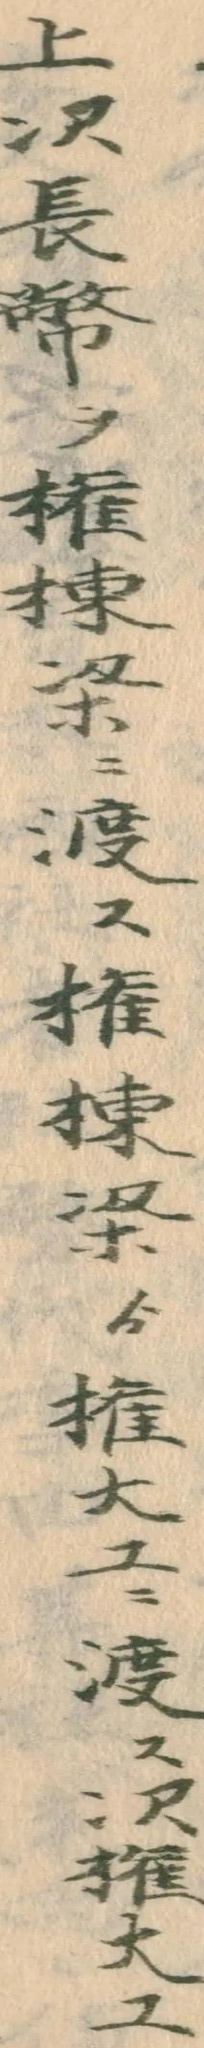上次長幣ヲ権棟梁ニ渡ス権棟梁ゟ権大工ニ渡ス次権大工
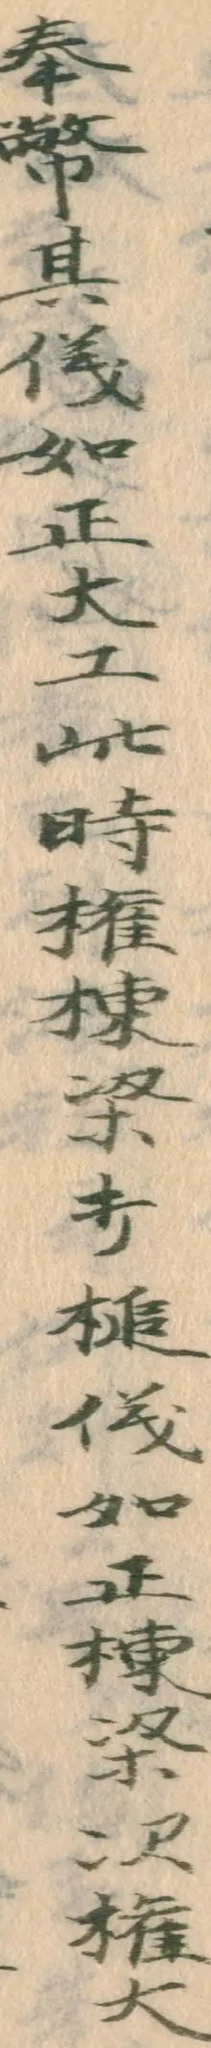奉幣其儀如正大工此時権棟梁打槌儀如正棟梁次権大
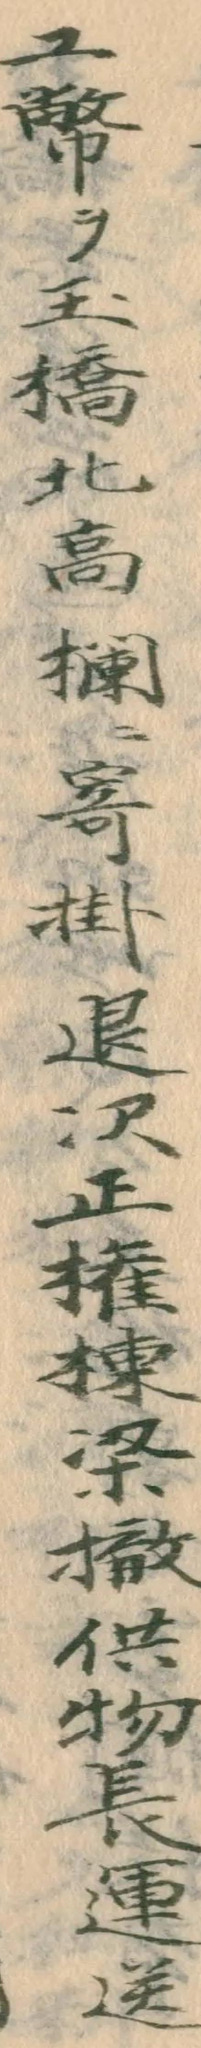工幣ヲ玉橋北高欄ニ寄掛退次正権棟梁撤供物長運送
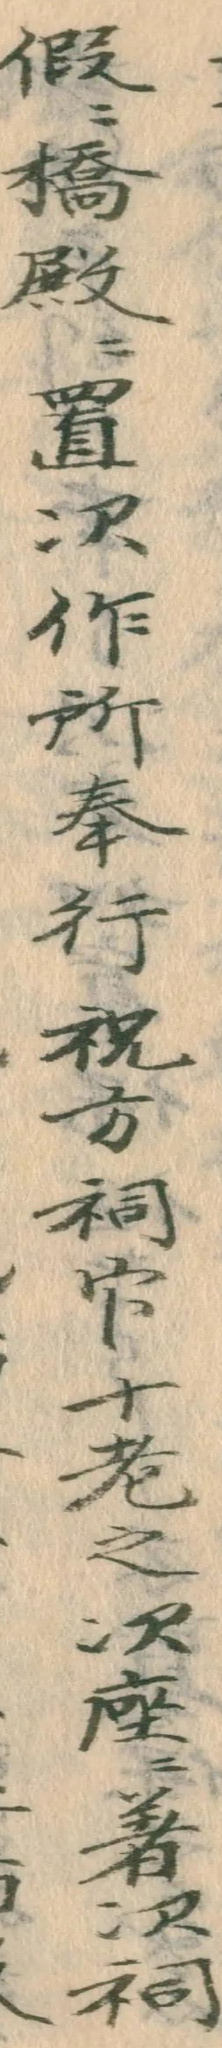仮ニ橋殿ニ置次作所奉行祝方祠官十老之次座ニ着次祠
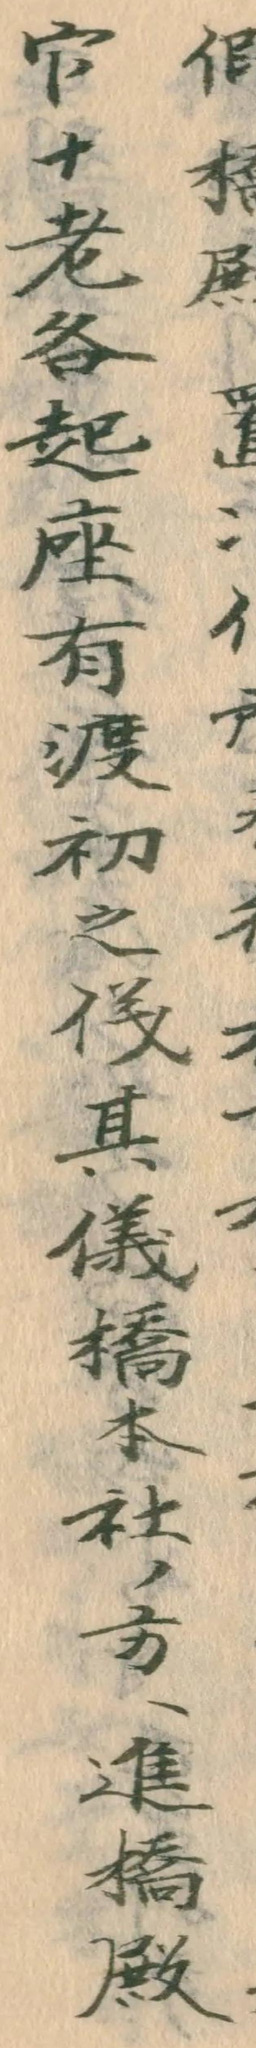官十老各起座有渡初之儀橋本社ノ方ヘ進橋殿
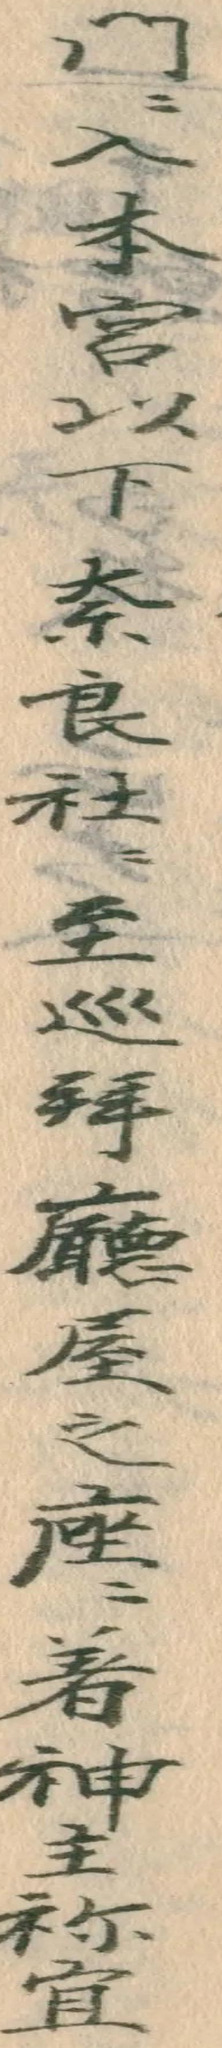門ニ入本宮以下奈良社ニ至巡拝庁屋之座ニ着神主祢宜
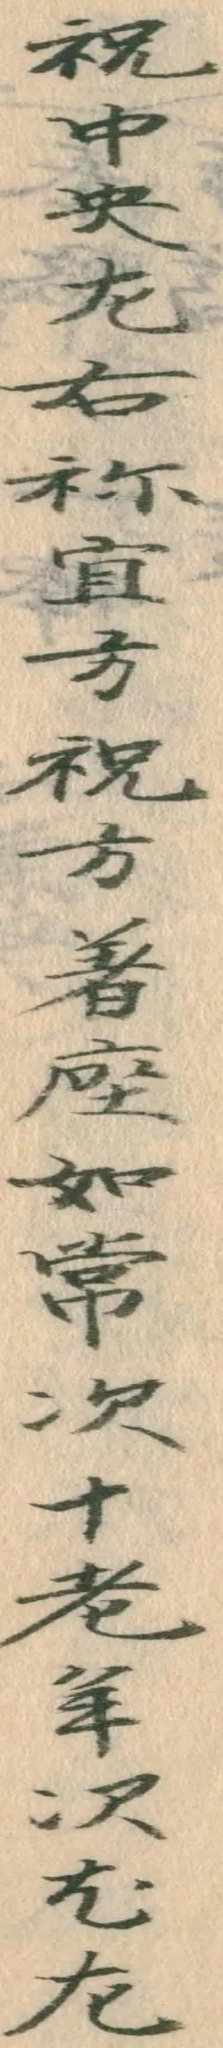祝中央左右祢宜方祝方着座如常次十老年次尤左
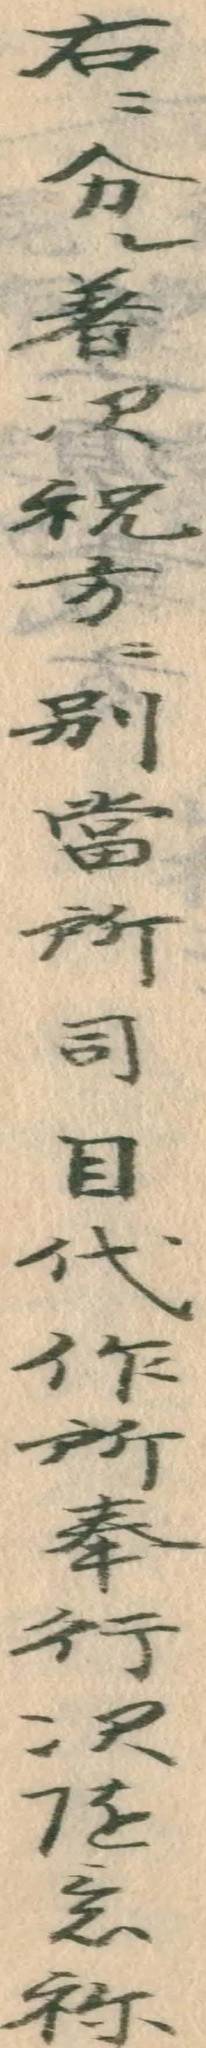右ニ分レ着次祝方ニ別当所司目代作所奉行次随意祢
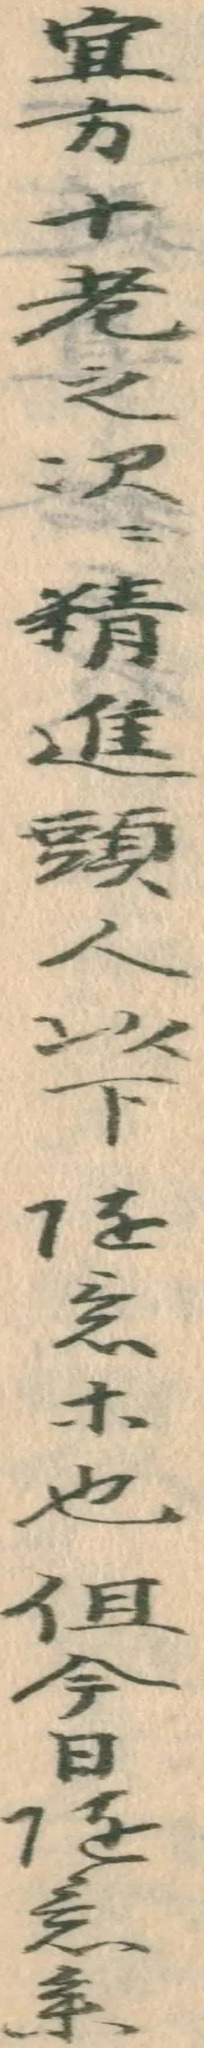宣方十老之次ニ精進頭人以下随意等也但今日随意参
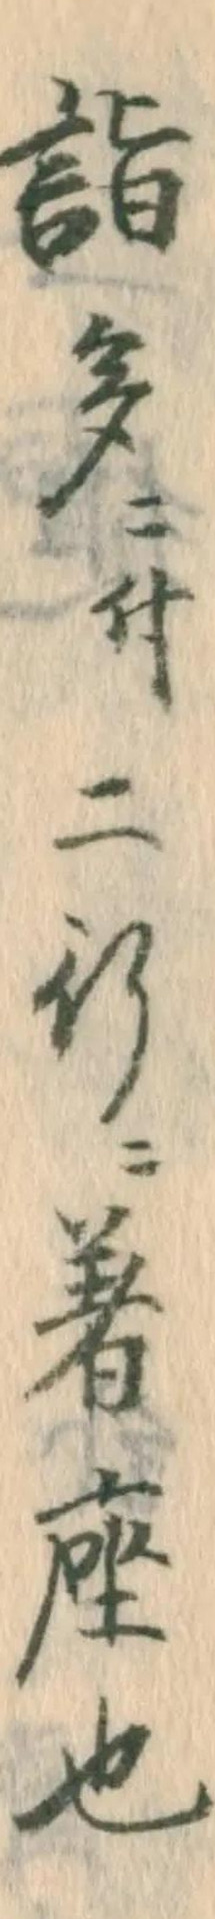詣多ニ付二行ニ着座也
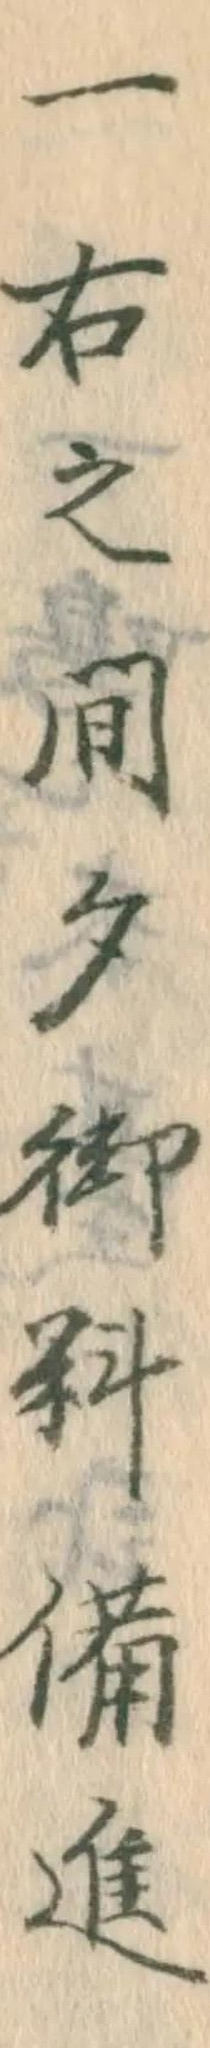一右之間夕御料備進
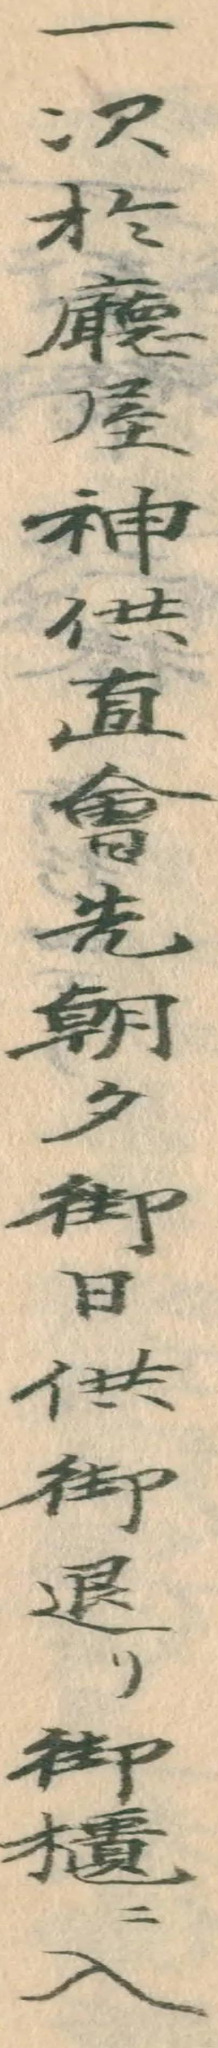一次於庁屋神供直会先朝夕御日供御退リ御櫃ニ入
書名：賀茂社記録. 第17冊
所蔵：国立国会図書館 National Diet Library, JAPAN
